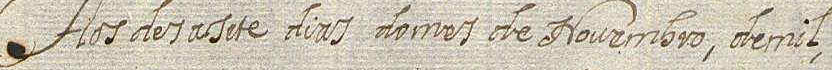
Aos desasete dias do mes de Nouembro, de mil,
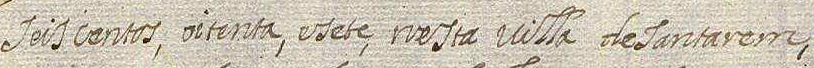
seiscentos, oitenta, e sete, nesta uilla de santarem,
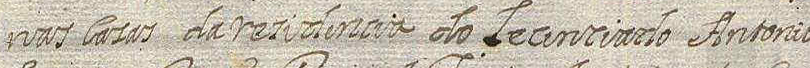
nas cazas da rezidencia do Lecenciado Antonio
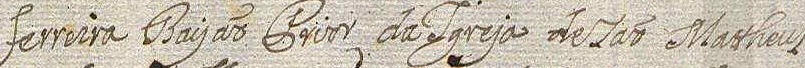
Ferreira Bayaõ Prior, da Igreja de Saõ Matheus
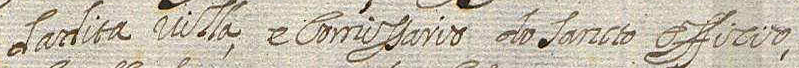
da dita uilla, e Comissario do Sancto Officio,
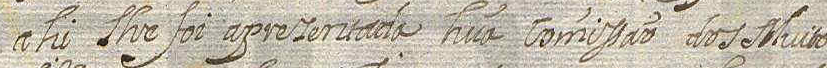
ahi lhe foi aprezentada huā comissaõ dos Muito
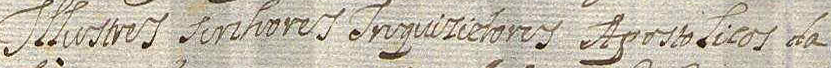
Illustres Senhores Inquizidores Apostolicos da
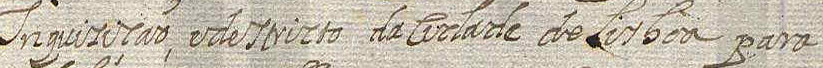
Inquiziçaõ, e destricto da Cidade de Lisboa para
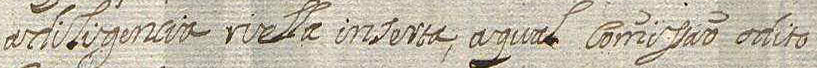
a diligencia nella inserta, a qual com̄issaõ o dito
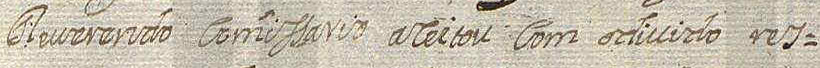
Reuerendo com̄issario aceitou com o diuido res
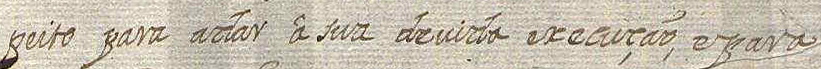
peito para a dar à sua deuida execuçaõ, e para
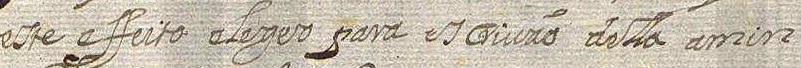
este effeito elegeo para escriuaõ della a min
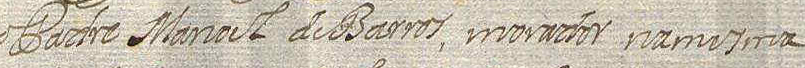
o Padre Manoel de Barros, morador na mesma
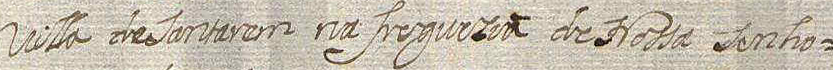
Uilla de Santarem na freguezia de Nossa Senho
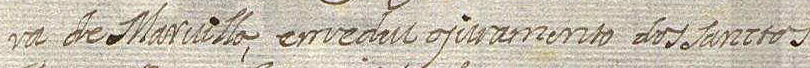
ra de Maruilla, e me deu o juramento dos sanctos
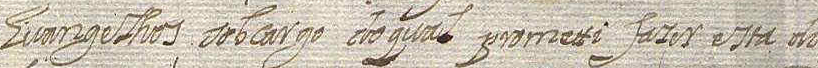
Euangelhos sob cargo do qual prometti fazer esta di
